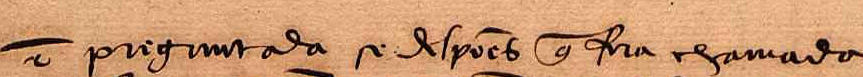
item preguntada se despōes q̄ fora chamada
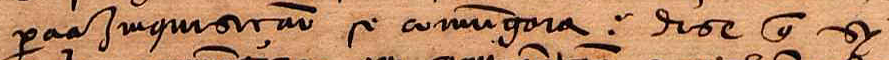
ꝑa a Jmquisição se comūgara: dise q̄ sy
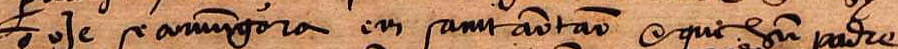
q̄ oJe se comūgara em samtãotão e que hū padre
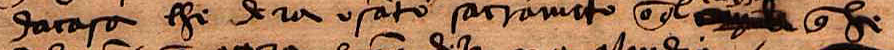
da casa lhe dera o s̄ato sacramēto o q̄l _ q̄ he
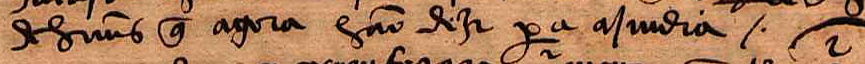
de huūs q̄ agora hão de Jr ꝑa a Jmdia /. ī
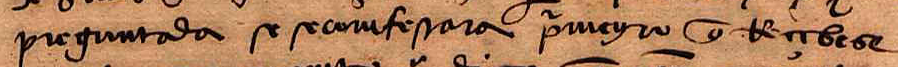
preguntada se se comfessara p̄meyro q̄ Recebese
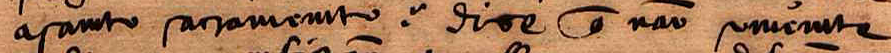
a samto sacramemto? dise q̄ não somemte
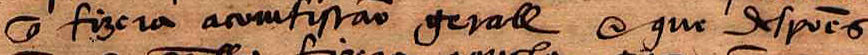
q̄ fizera a comfissão gerall e que despoēs
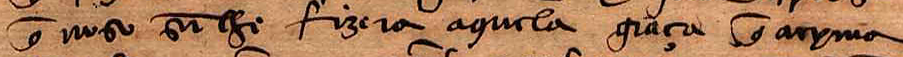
q̄ noso s̄or lhe fizera aquela graça q̄ acyma
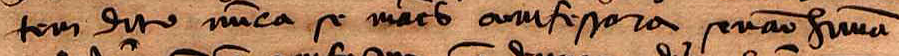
tem dito nūca se māes comfessara senão huūa
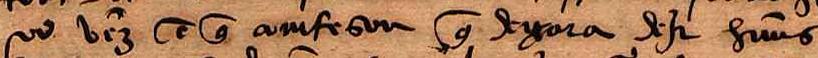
soo vēz ē q̄ comfesou q̄ dexara de Jr huūs
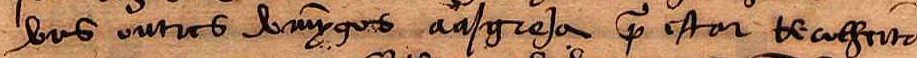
dous outros domȳgos aa JgreJa p̄o estar Recolheita
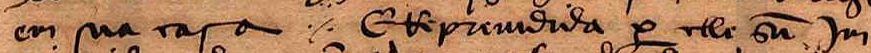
em sua casa ./. E Repremdida ꝑ elle s̄or Jm
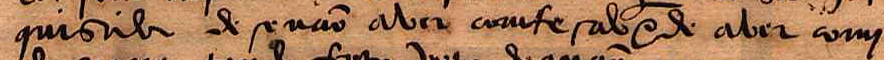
quisidor de se naõ aver comfesado e de aver comj
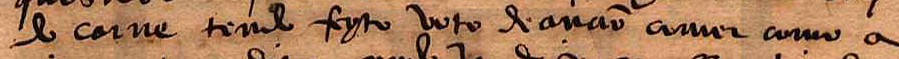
do carne tendo feyto voto de a naõ comer como a
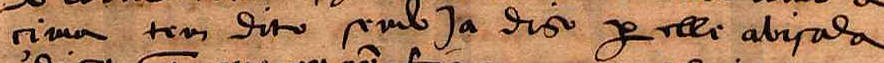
cima tem dito semdo Ja diso ꝑ elle avisada
